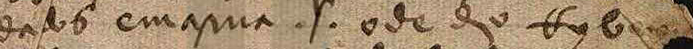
dados em a sua .s. o de djo Rybey
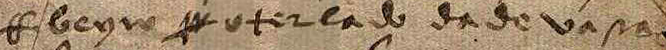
Ribeyro item o terlado da devasa
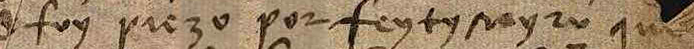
d foy prezo por feytyseyro que
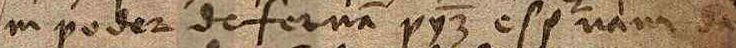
m poder de fernā pyz̄ espruam da
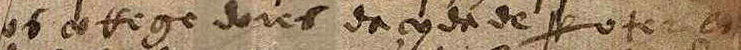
os coRegedores da cydade item o tela
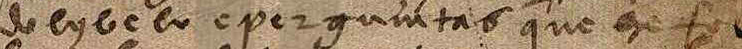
do lybelo e pergumtas que lhe for
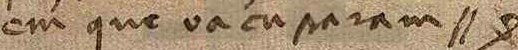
em que o acusaram //
